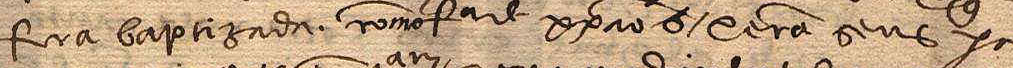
fora baptizada. c̄omo fa de xpãos / e er̄a seus pa
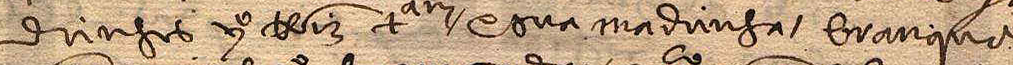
drinhos yo Roīz tam / e sua madrinha / branqua
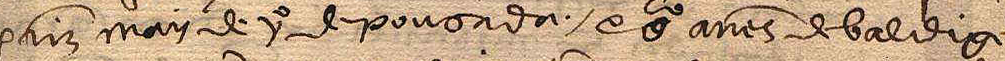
prīz may de yo de pousada./ e gco anēs de baldigē
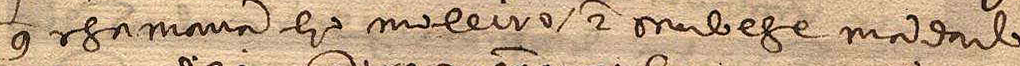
q̄ chamauā ho molleiro / item sendolhe mādado
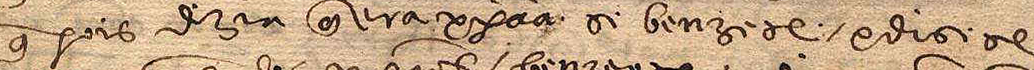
q̄ pois dizia q̄ era xp̄aa. se benzese./ e disese
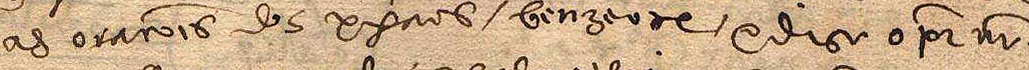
as oracões dos xpãos / benzeose / e dise o p̄r nr̄.
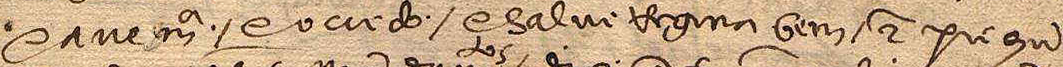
e aue ma./ e o credo./ e salue Regina bem / item pregū
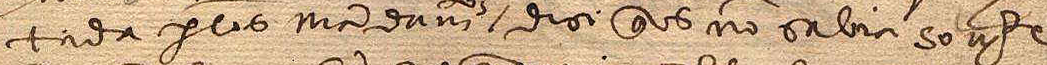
tada p̄los mādamtos / dise q̄ os nō sabia somte
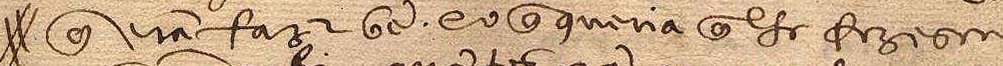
q̄ erā fazer bē. e o q̄ queria q̄ lhe fezesem
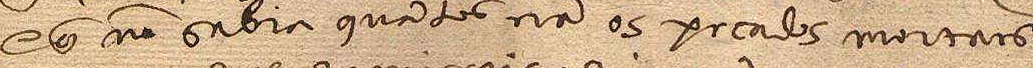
e q̄ n̄o sabia quātos erā os pecados mortaes
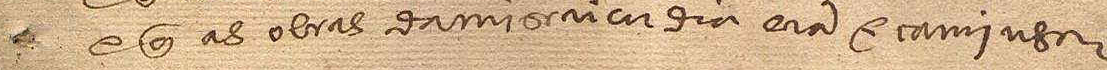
e q̄ as obras da misericordia erā ēcamjnhar
